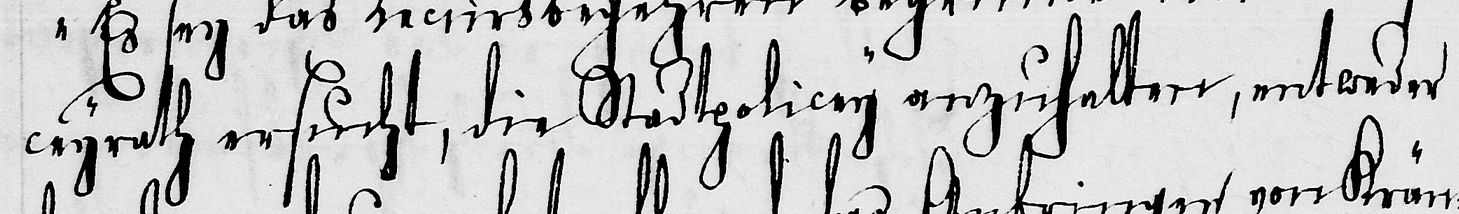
ceyrath ersucht, die Stadtpolicey anzuhalten, entweder
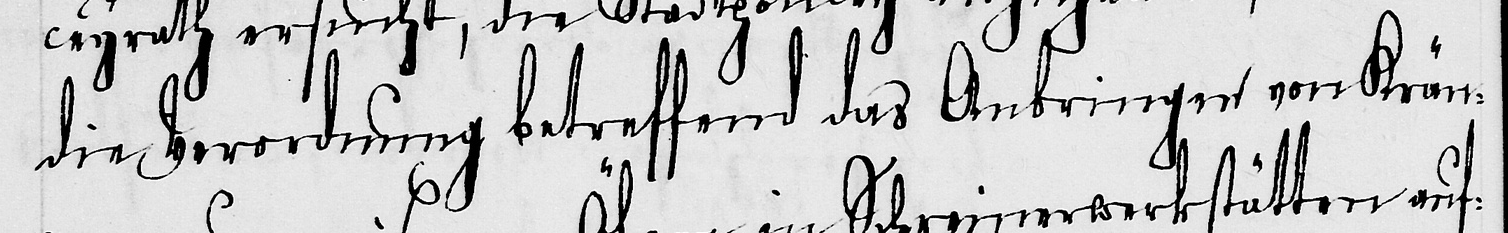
die Verordnung betreffend das Anbringen von Krän¬
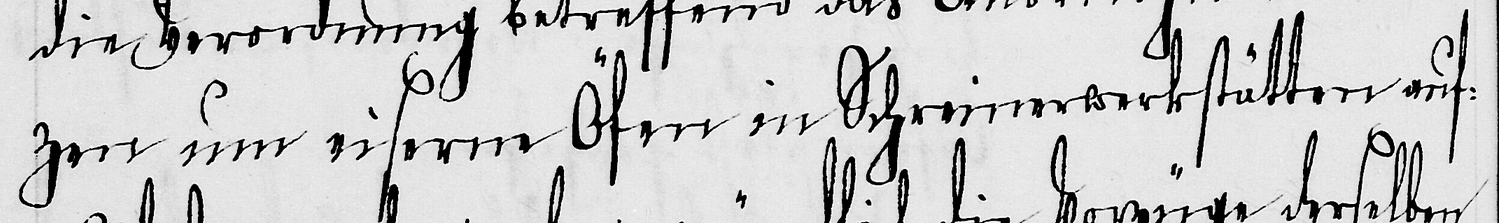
zen um eiserne Öfen in Schreinerwerkstätten auf¬
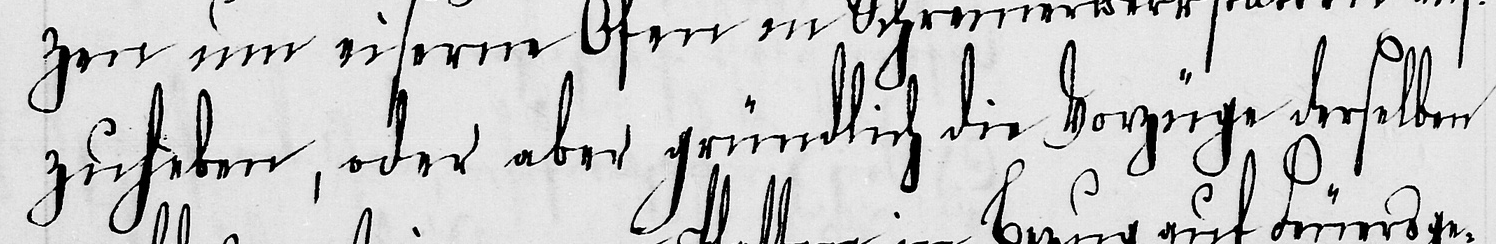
zuheben, oder aber gründlich die Vorzüge derselben
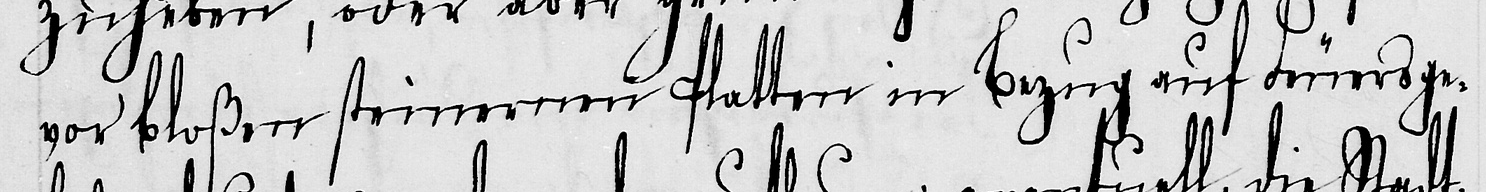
vor bloßen steinernen Platten in Bezug auf Feuersge¬
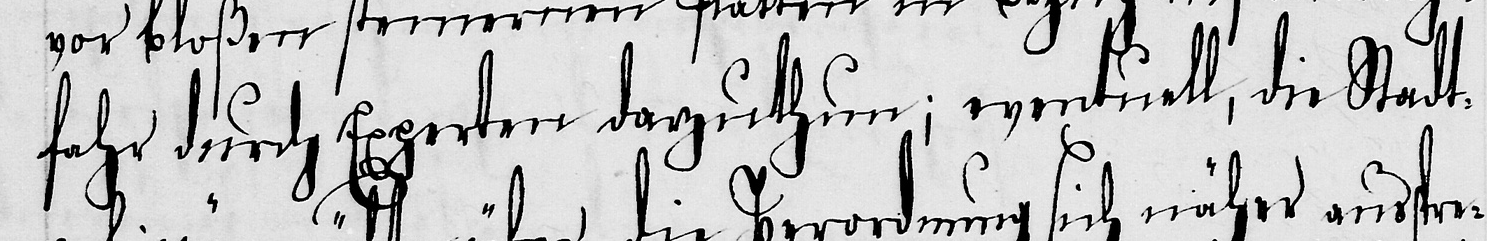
fahr durch Experten darzuthun; eventuell, die Stad¬
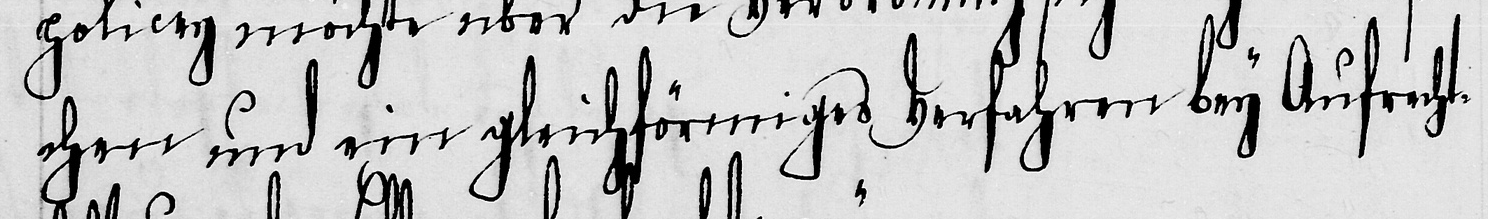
echen und ein gleichförmiges Verfahren bey Aufrecht¬
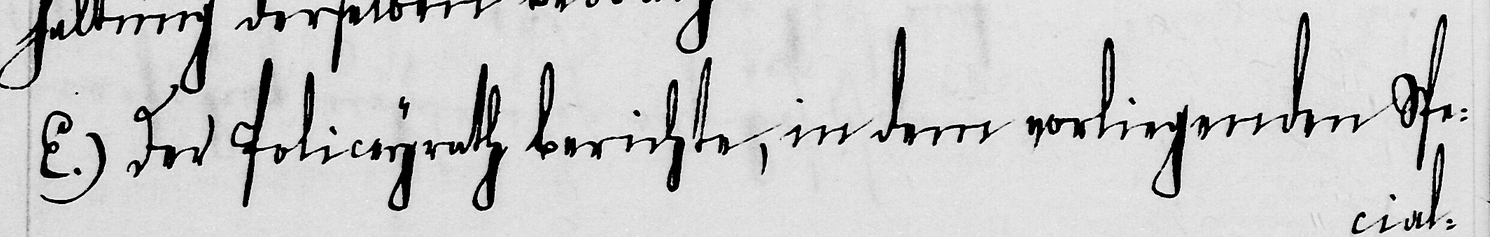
E.) Der Policeyrath berichte, in dem vorliegenden Sp¬
